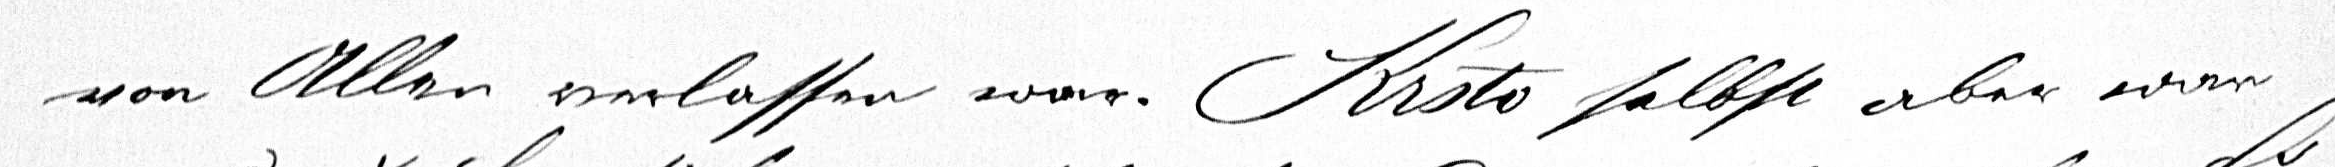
von Allen verlassen war. Krsto selbst aber war
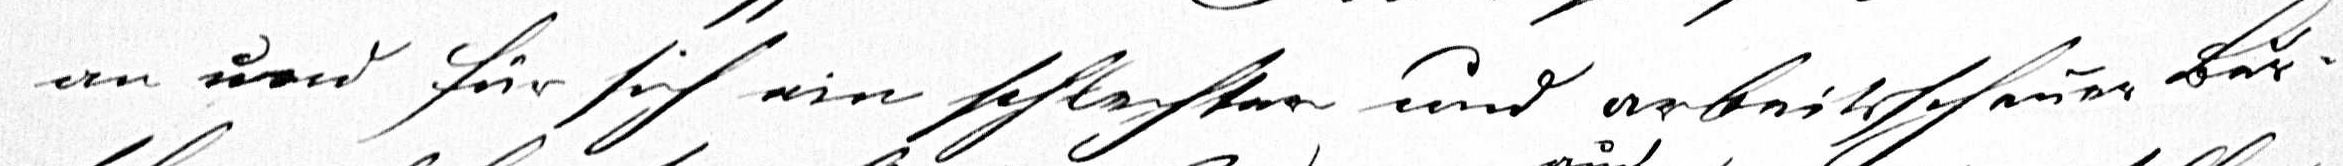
an und für sich ein schlechter und arbeitsscheuer Bur¬
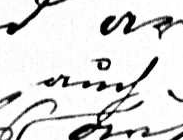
auch
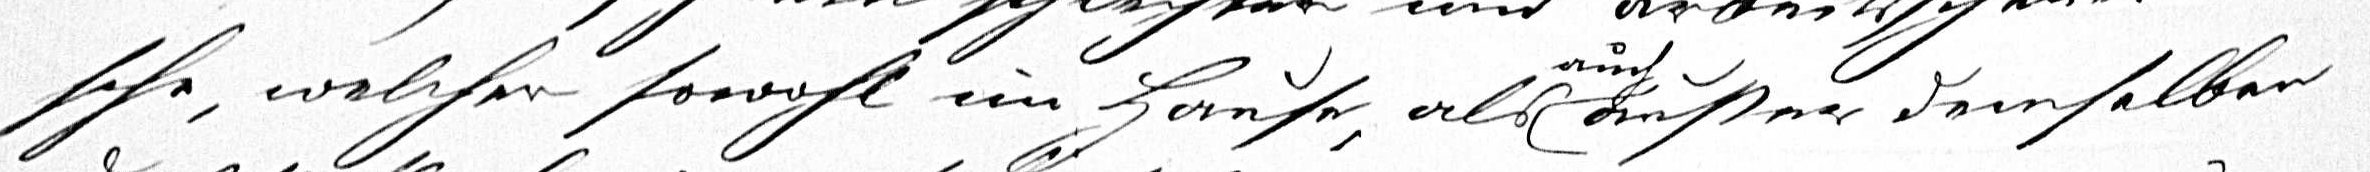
sche, welcher sowohl im Hause, als außer demselben
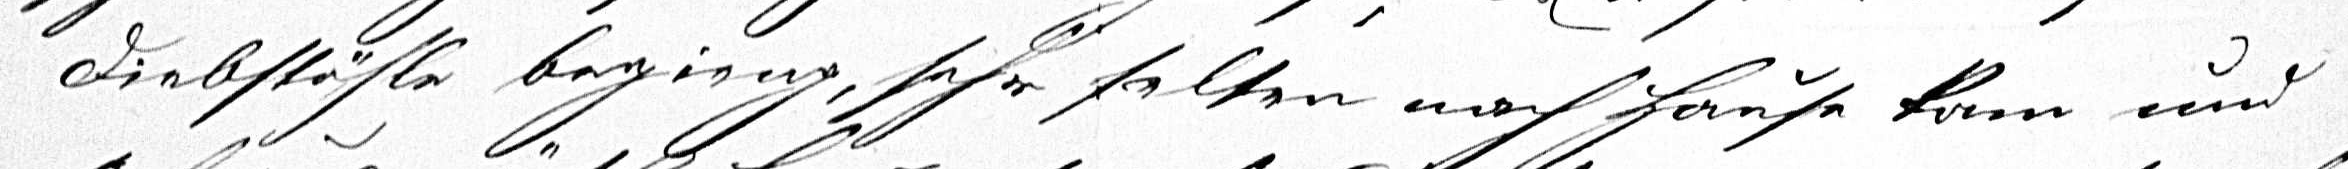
Diebstähle beging, sehr selten nach Hause kam und
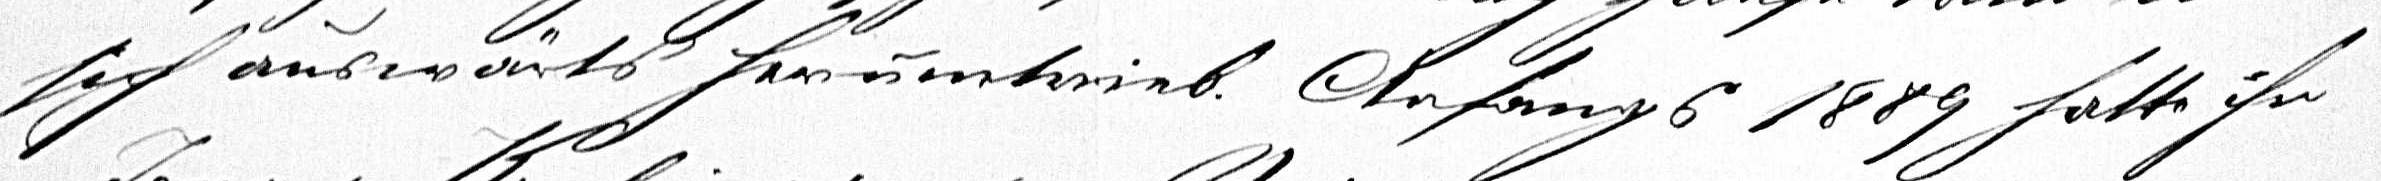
sich auswärts herumtrieb. Anfangs 1889 hatte ihn
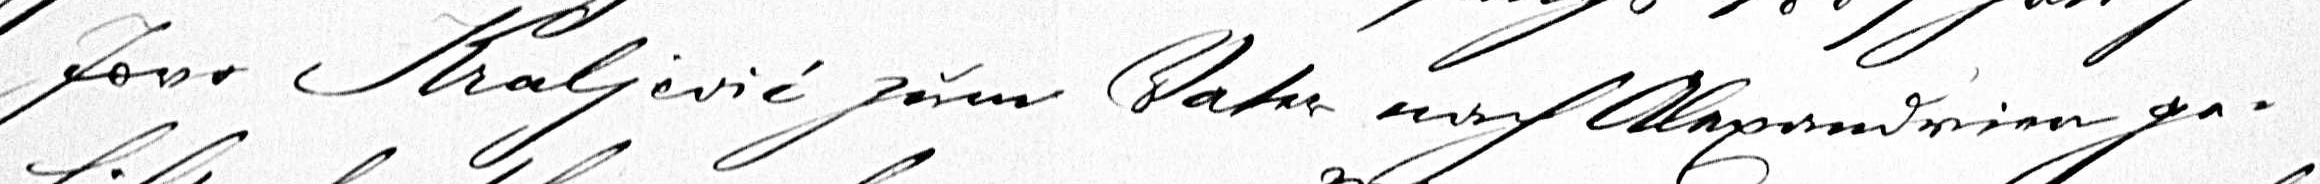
Jova Kraljević zum Vater nach Alexandrien ge¬
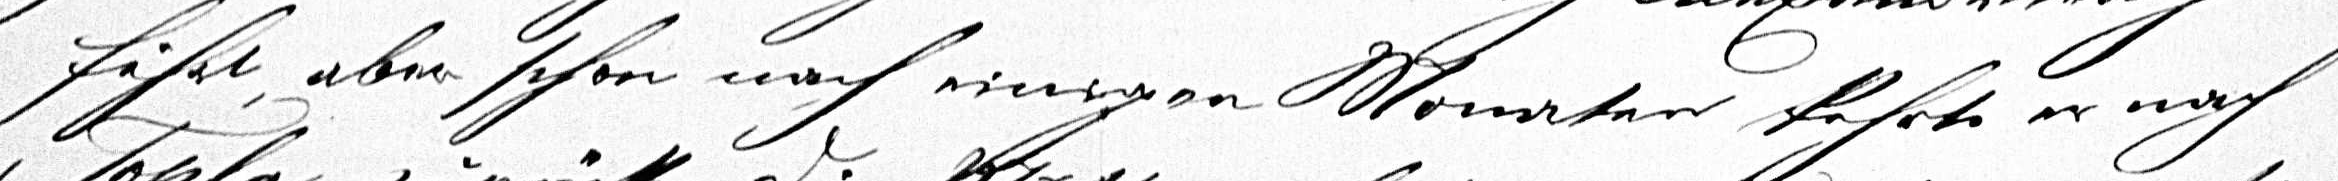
führt, aber schon nach einigen Monaten kehrte er nach
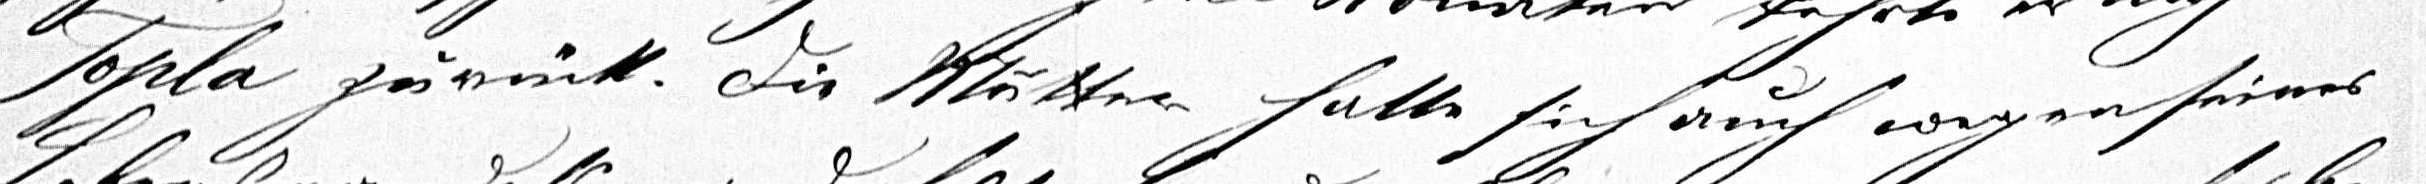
Topla zurück. Die Mutter hatte sich auch wegen seines
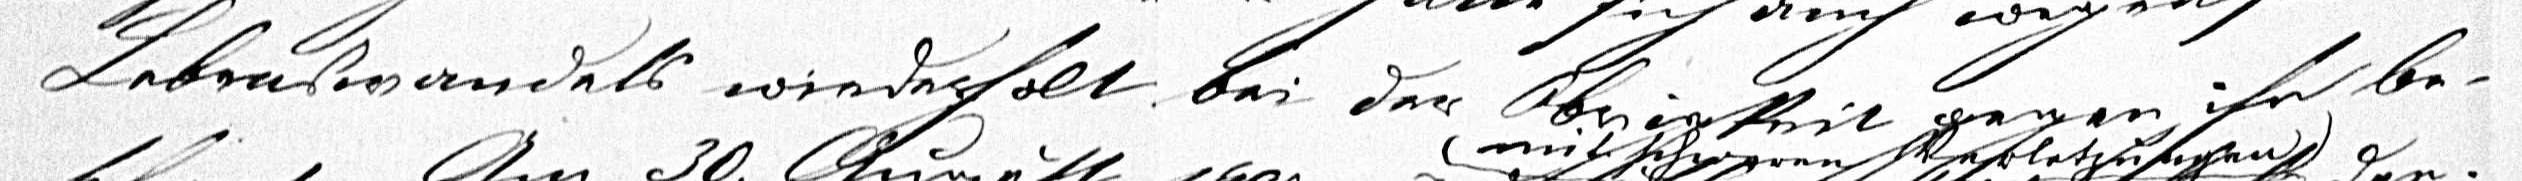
Lebenswandels wiederholt bei der Obrigkeit gegen ihn be¬
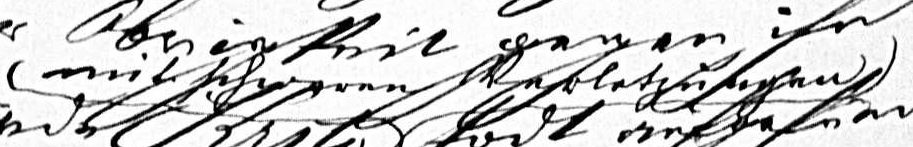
mit schweren Verletzungen
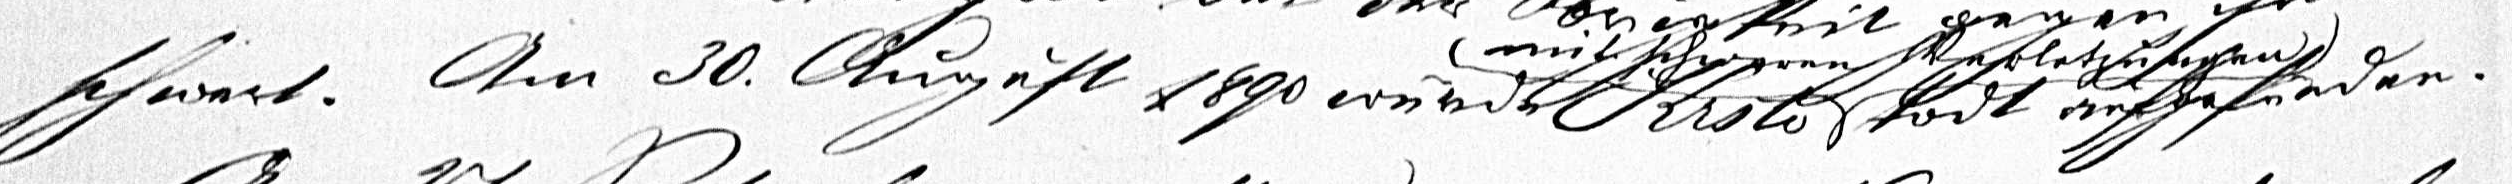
schwert. Am 30. August 1890 wurde Krsto todt aufgefunden.
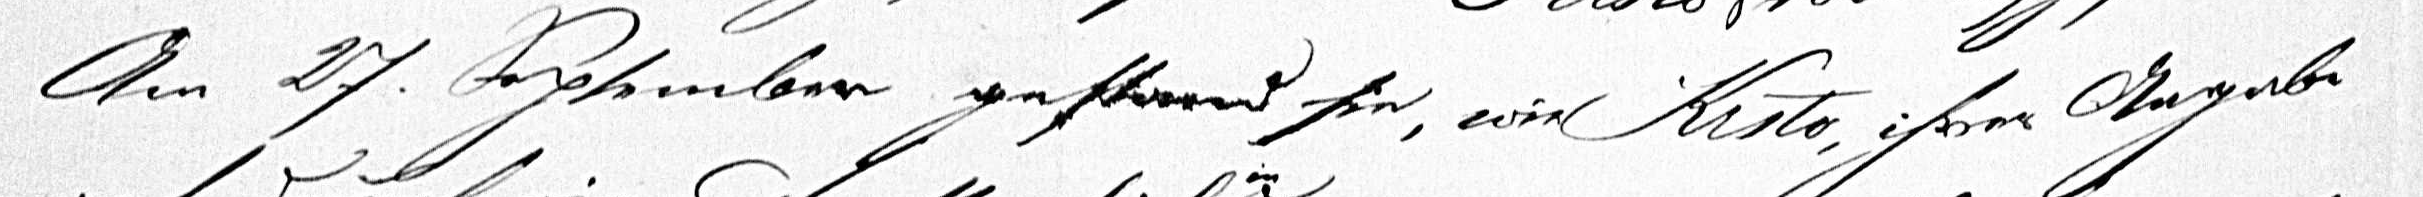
Am 27. September gestand sie, wie Kristo, ihrer Angaben
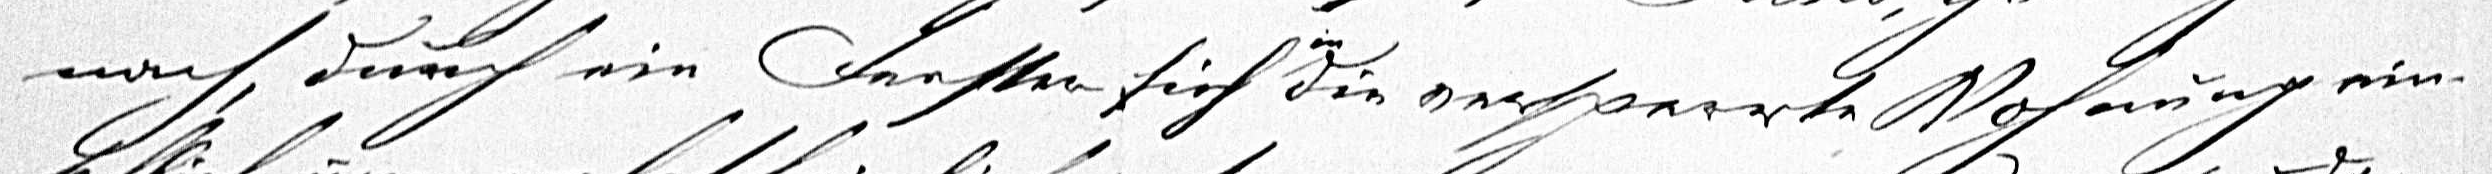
nach, durch ein Fenster sich die versperrte Wohnung ein¬
